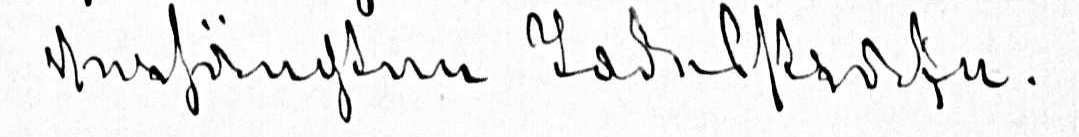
verhängten Todesstrafe.
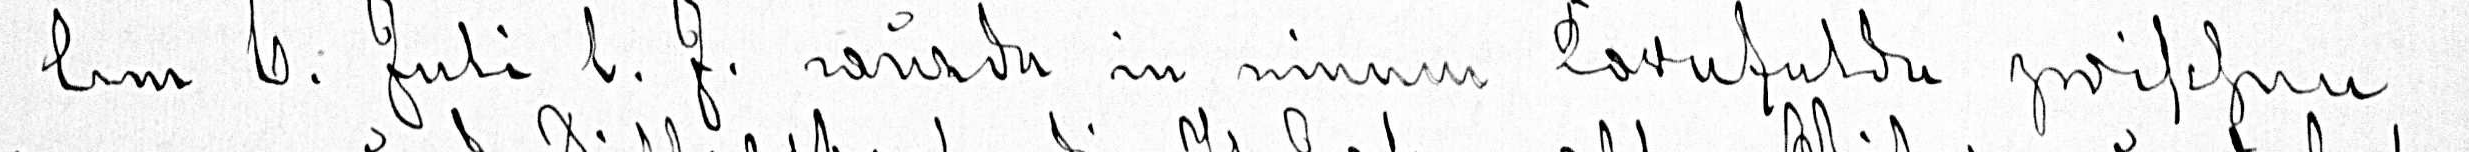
Am 6. Juli l. J. wurde in einem Korfelde zwischen
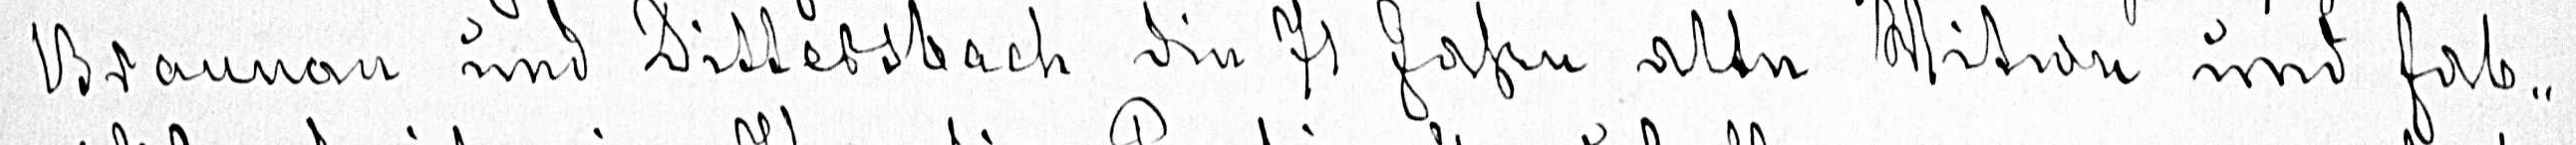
Braunau und Dittersbach die 71 Jahre alte Witwe und Fab¬
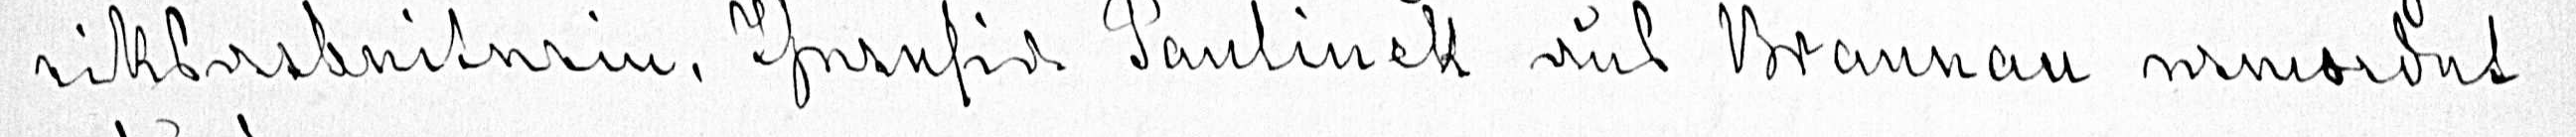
riksarbeiterin, Theresia Paulinek aus Braunau ermordet
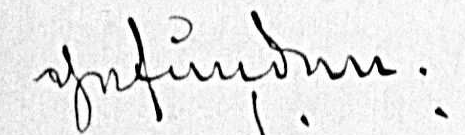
gefunden.
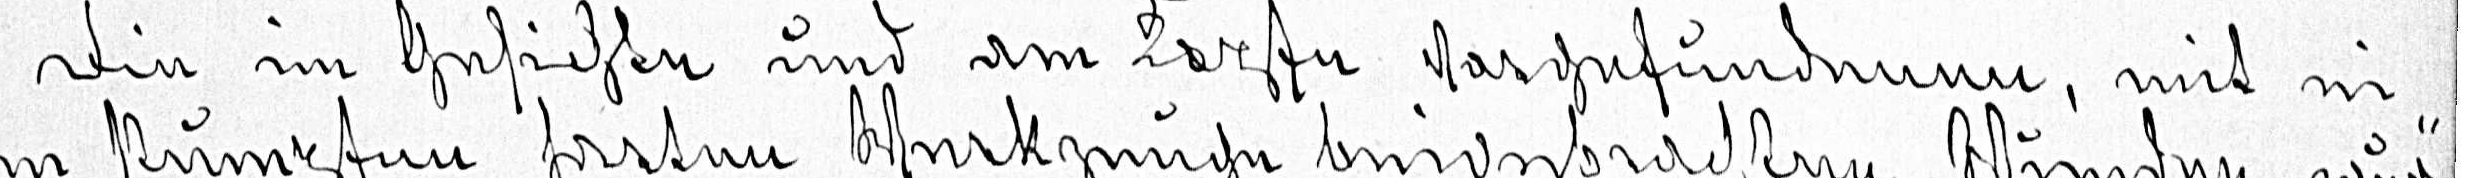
Die in Gesichte und am Kopfe vorgefundenen, mit ei¬
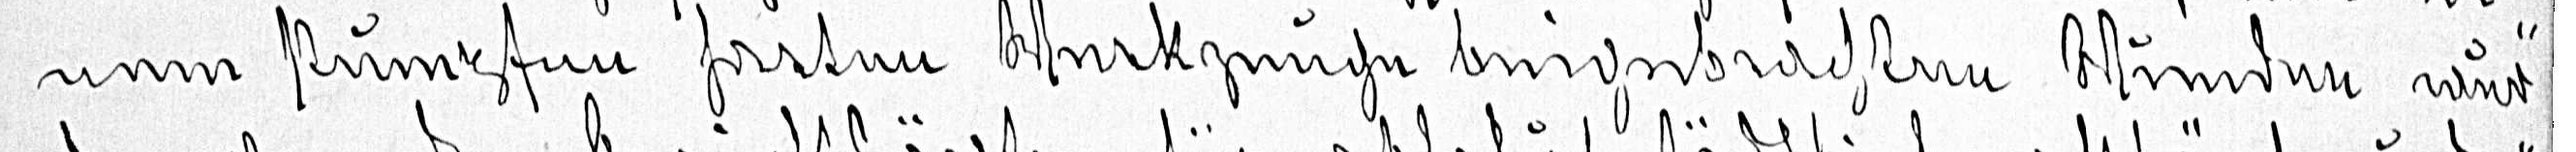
nem Stumpfen harten Werkzeuge beigebrachten Wunden wur¬
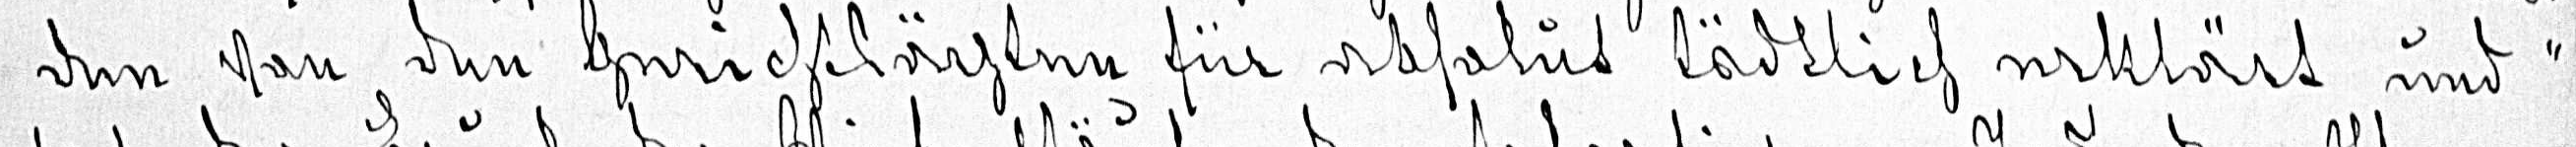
den von den Gerichtsärzten für absolut tödtlich erklärt und
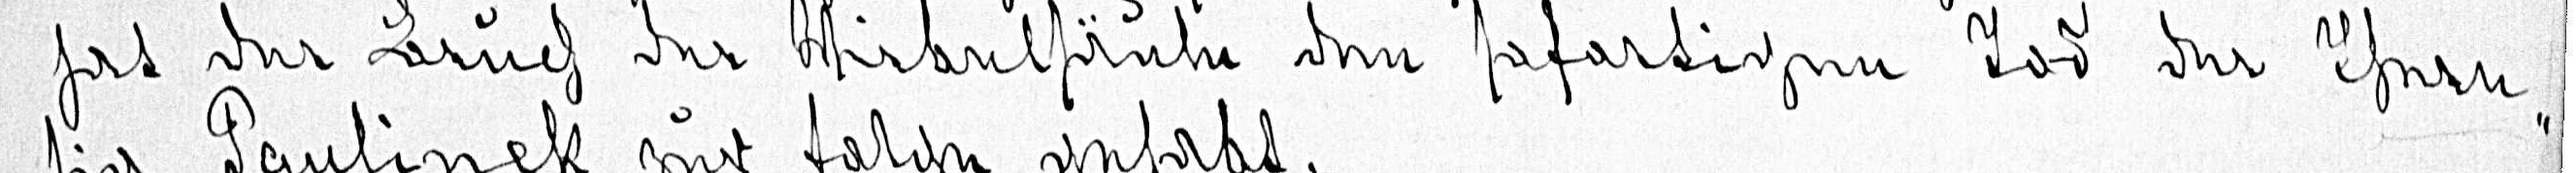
hat der Bruch der Wirbelsäule den sofortigen Tod der There¬
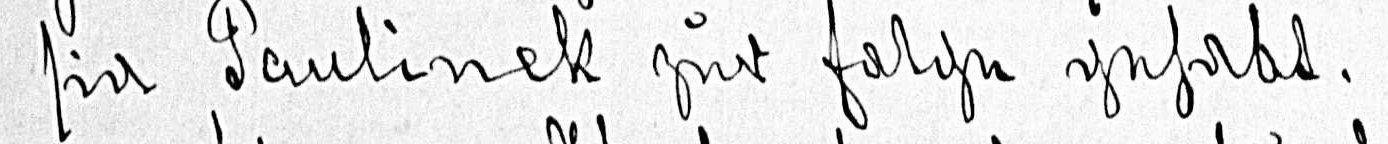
sia Paulinek zur Folge gehabt.
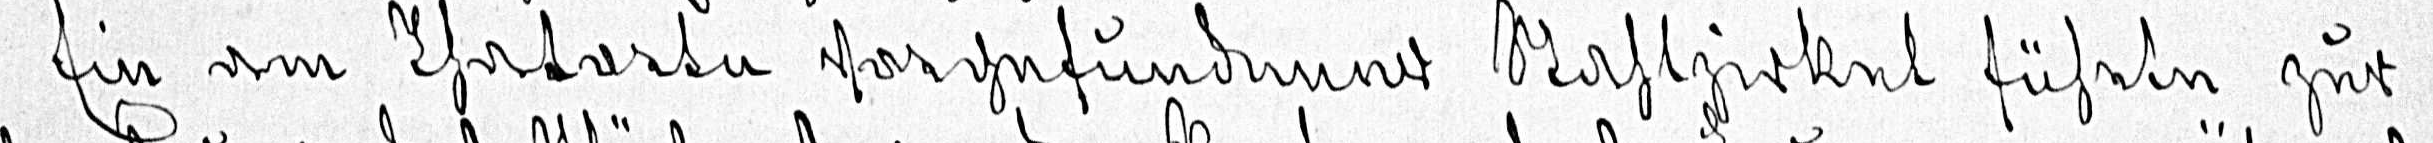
Ein am Thatorte vorgefundener Stahlzirkel führte zur
